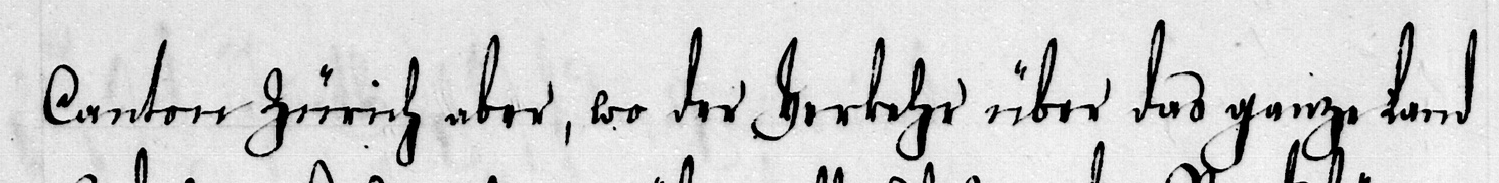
Canton Zürich aber, wo der Verkehr über das ganze Land
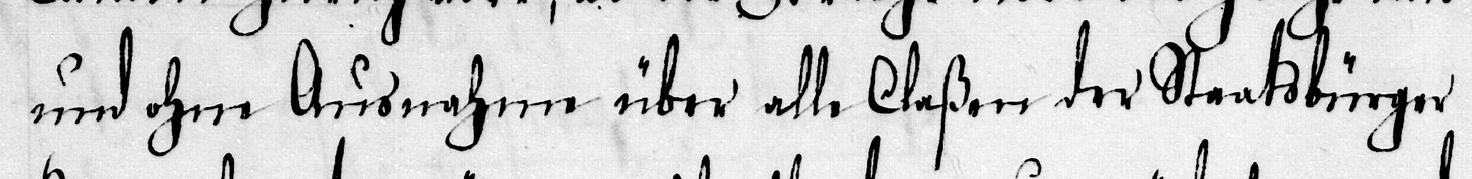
und ohne Ausnahme über alle Claßen der Staatsbürger
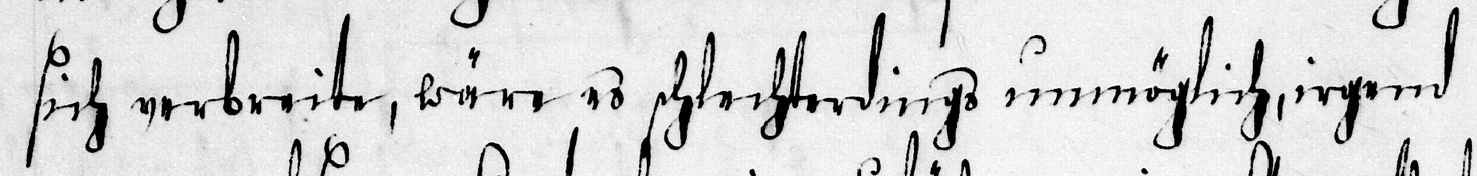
sich verbreite, wäre es schlechterdings unmöglich, irgend
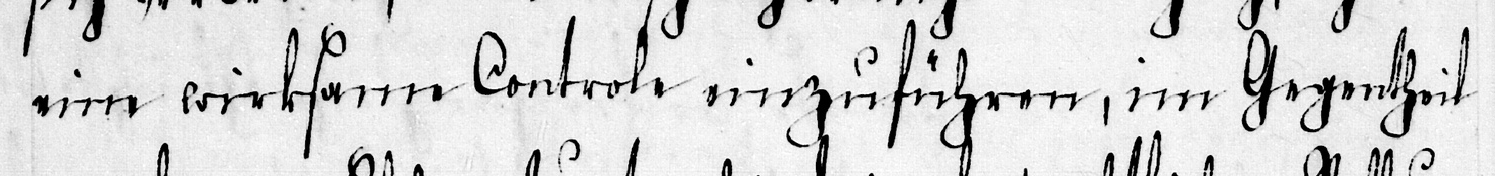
eine wirksame Controle einzuführen, im Gegentheil
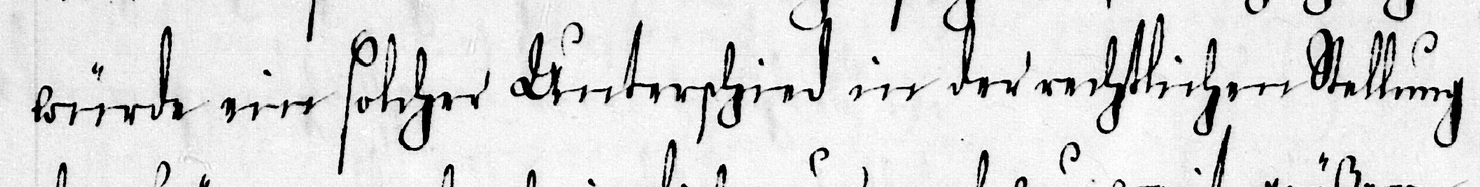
würde ein solcher Unterschied in der rechtlichen Stellung
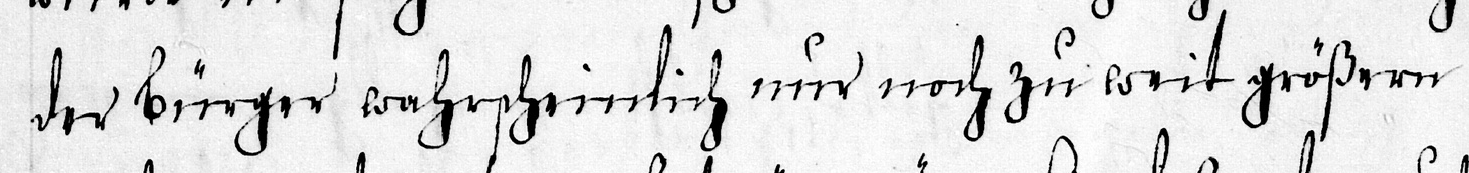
der Bürger wahrscheinlich nur noch zu weit größern
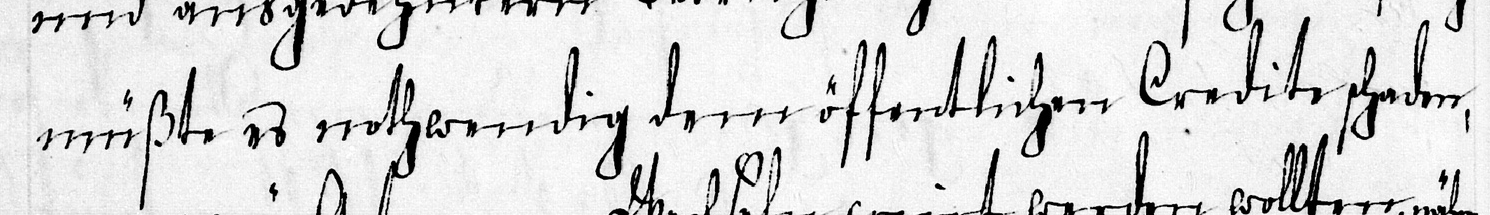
müßte es nothwendig dem öffentlichen Credite schaden,
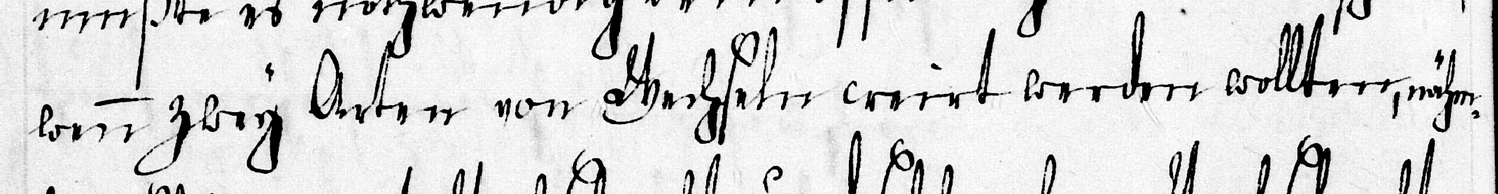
wenn zwey Arten von Wechseln creirt werden wollten, nähm¬
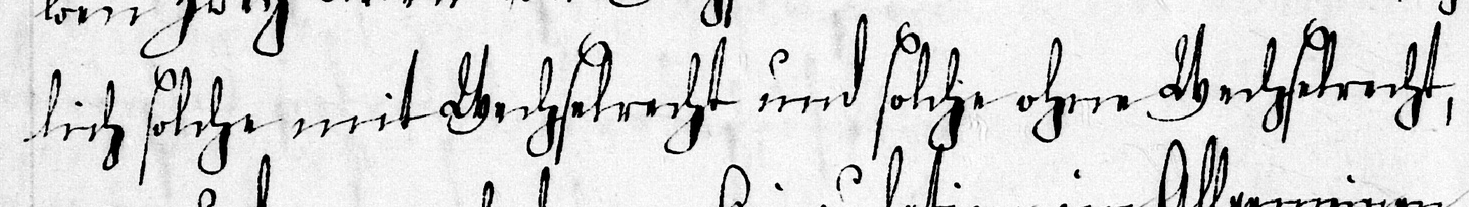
lich solche mit Wechselrecht und solche ohne Wechselrecht,
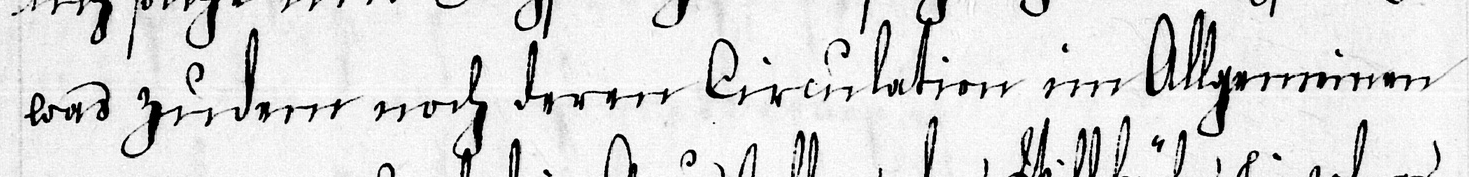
was zudem noch deren Circulation im Allgemeinen
